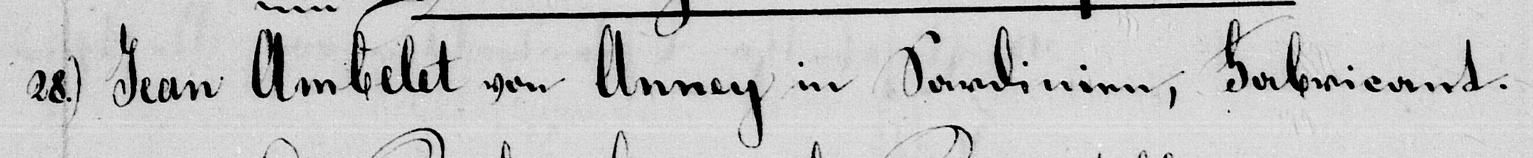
28.) Jean Ambelet von Anncy in Sardinien, Fabricant.
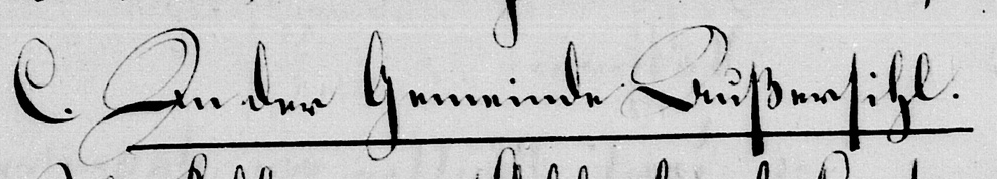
C. In der Gemeinde Außersihl.
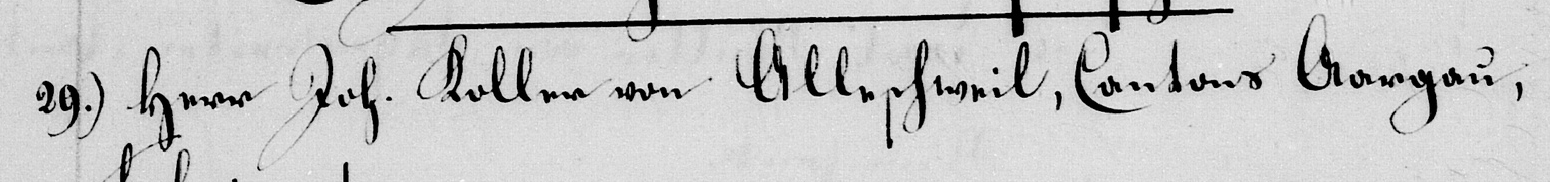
29.) Herr Joh. Koller von Allschweil, Cantons Aargau,
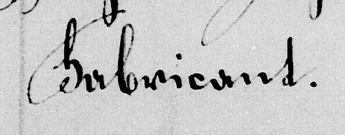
Fabricant.
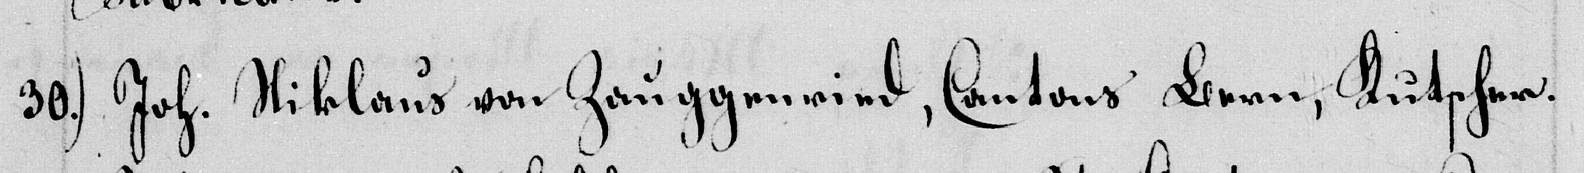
30.) Joh. Niklaus von Zauggenried, Cantons Bern, Kutscher.
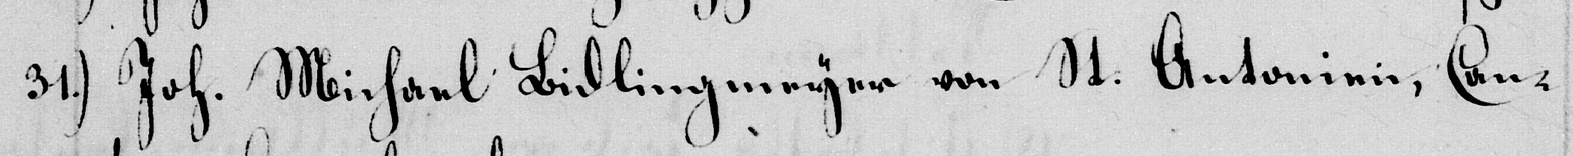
31.) Joh. Michael Lidlingmeyer von St. Antonien, Can¬
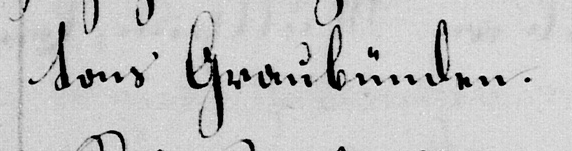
tons Graubünden.
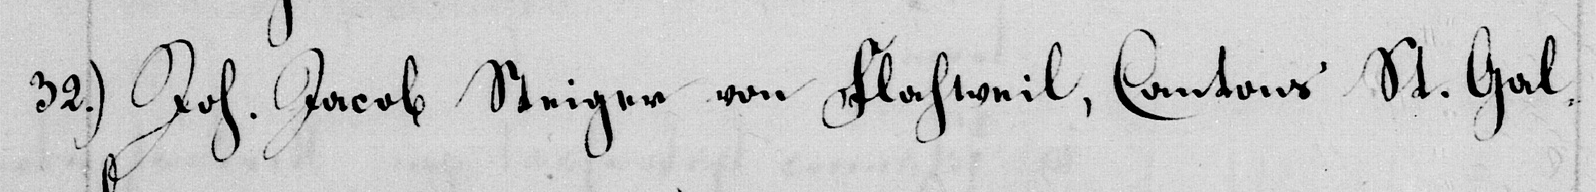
32.) Joh. Jacob Steiger von Flahweil, Cantons St. Gal¬
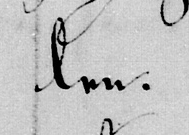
der
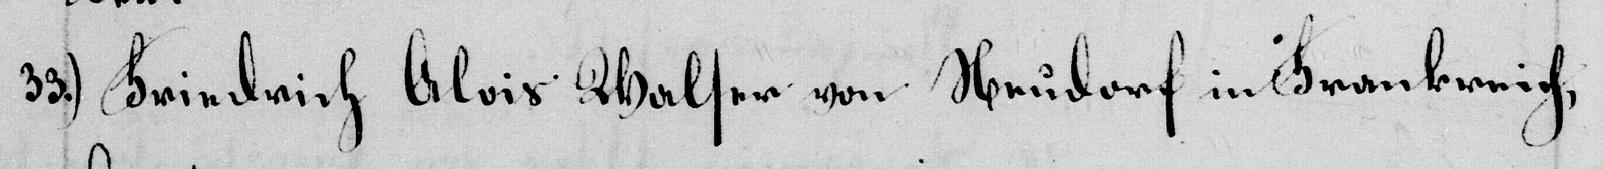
33.) Friedrich Alois Walser von Neudorf in Frankreich,
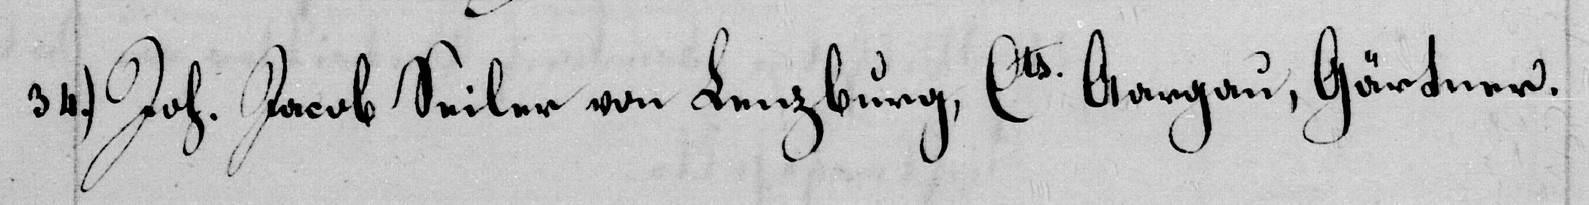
34.) Joh. Jacob Seiler von Lenzburg, Cts. Aargau, Gärtner.
